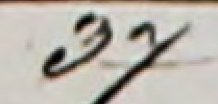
37
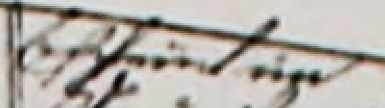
Erscheint im
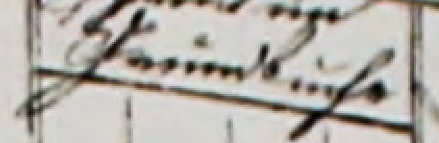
Grundbuche
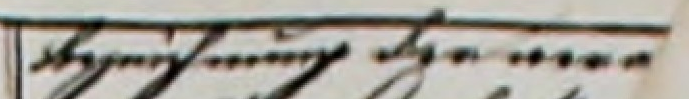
Bezeichnung der ver???
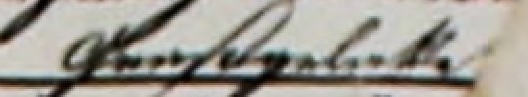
Genßgelake
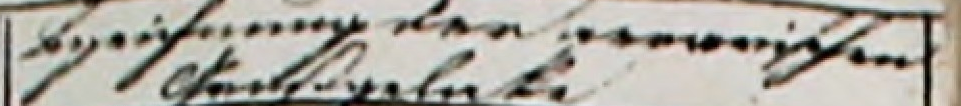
Bezeichnung der ver???
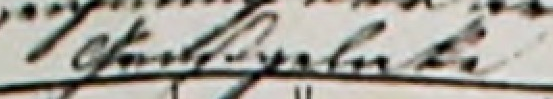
Genßgelake
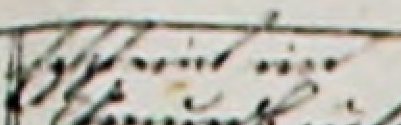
Erscheint im
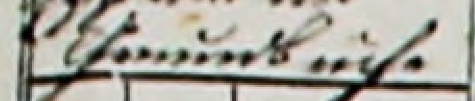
Grundbuche
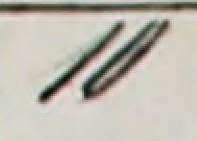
10
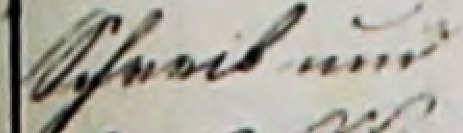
Schreib und
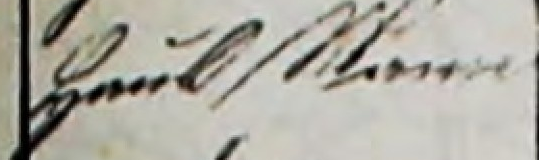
Haus Name
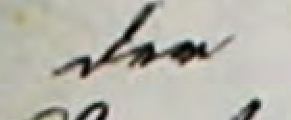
den
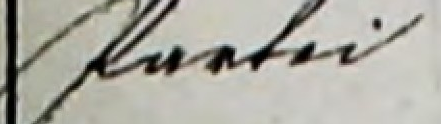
Partei.
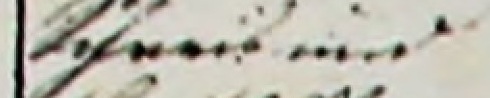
Schreib und
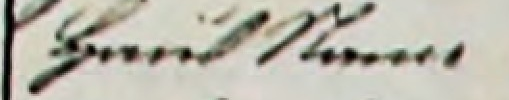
Haus Name
